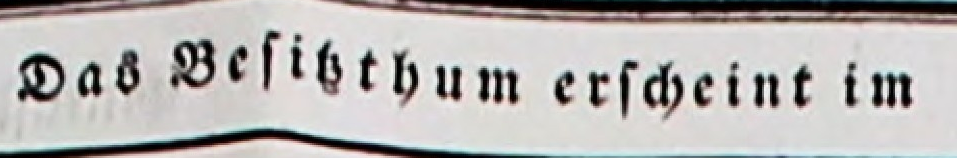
Das Besitzthum erscheint im
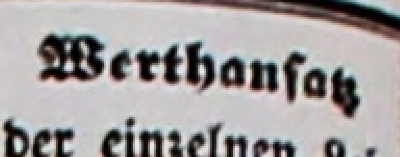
Werthansatz
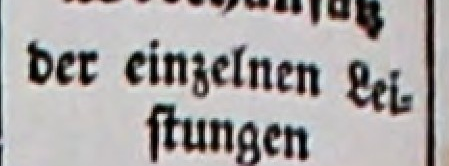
der einzelnen Lei=
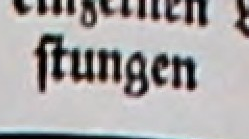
stungen
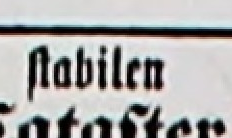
stabilen
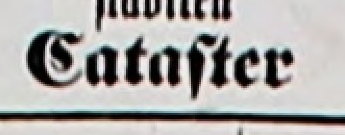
Cataster
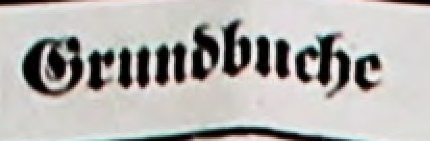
Grundbuche
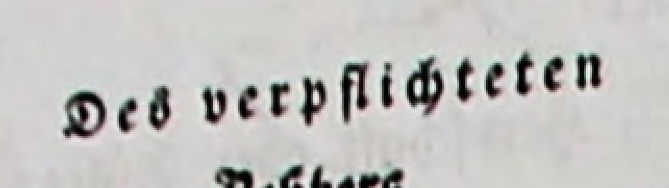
Des verpflichteten
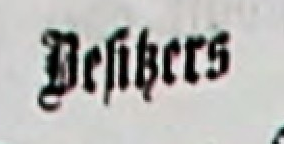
Besitzers
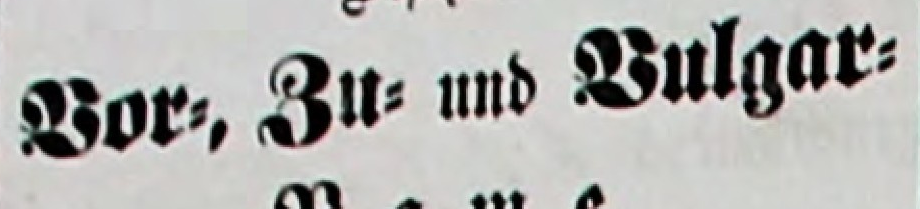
Vor=, Zu= und Vulgar=
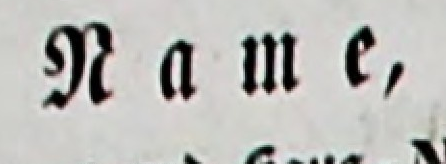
Name,
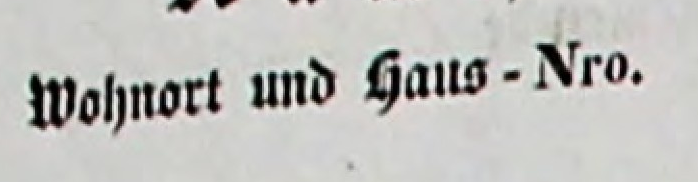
Wohnort und Haus - Nro.
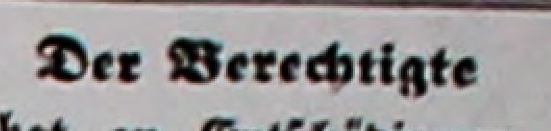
Der Berechtigte
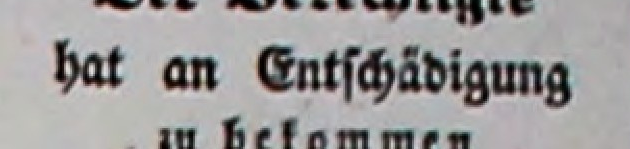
hat an Entschädigung
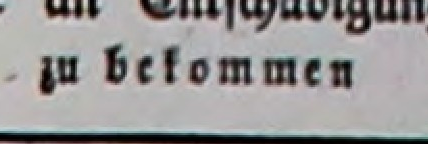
zu bekommen
